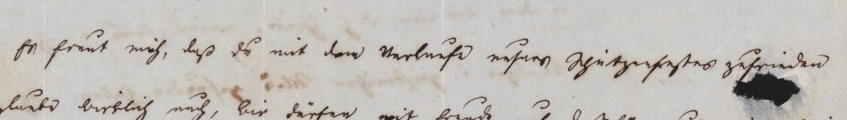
Es freut mich, daß Du mit dem Verlaufe unsers Schützenfestes zufrieden
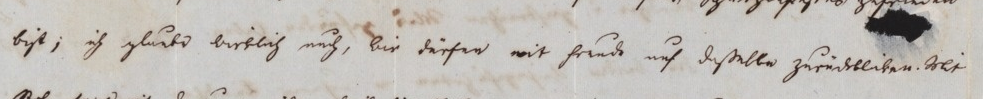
bist; ich glaube wirklich auch, wir dürfen mit Freude auf dasselbe zurückblicken. Mit
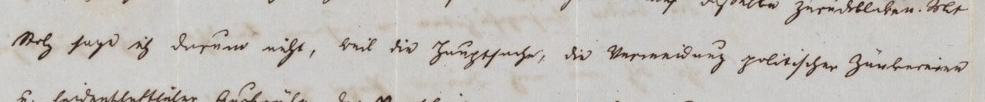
Stolz sage ich darum nicht, weil die Hauptsache, die Vermeidung politischer Zänkereien
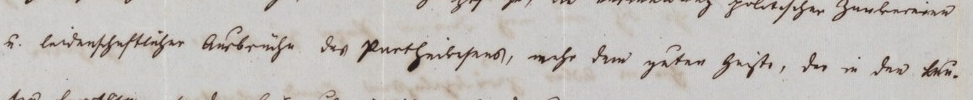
u. leidenschaftlicher Ausbrüche des Partheiwesens, mehr dem guten Geiste, der in den Leu-
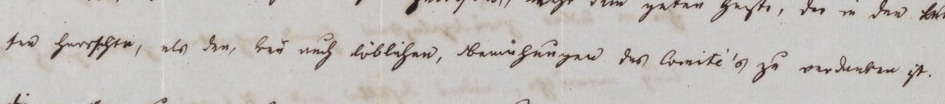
ten herrschte, als den, wenn auch löblichen, Bemühungen des Comité's zu verdanken ist.
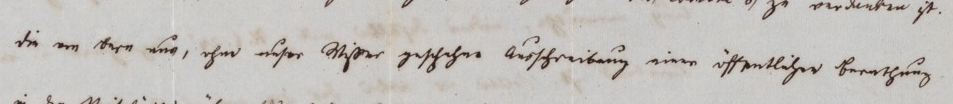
Die von Bern aus, ohne unser Wissen geschehne Ausschreibung einer öffentlichen Berathung
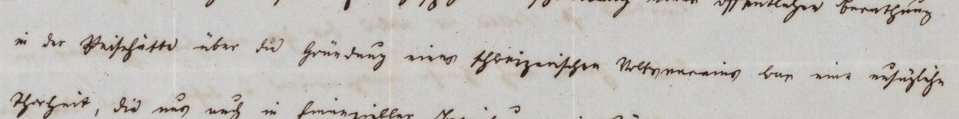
in der Speisehütte über die Gründung eines schweizerischen Volksvereins war eine unsägliche
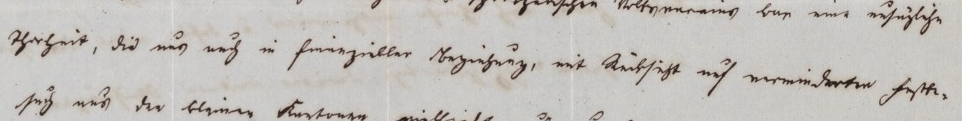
Thorheit, die uns auch in finanzieller Beziehung, mit Rücksicht auf verminderten Festbe-
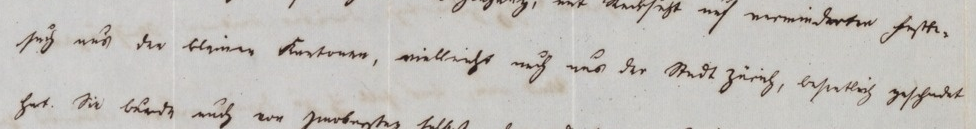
such aus den kleinen Kantonen, vielleicht auch aus der Stadt Zürich, wesentlich geschadet
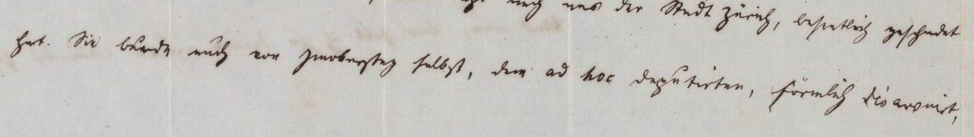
hat. Sie wurde auch von Imobersteg selbst, dem ad hoc Deputirten, förmlich désavouirt,
